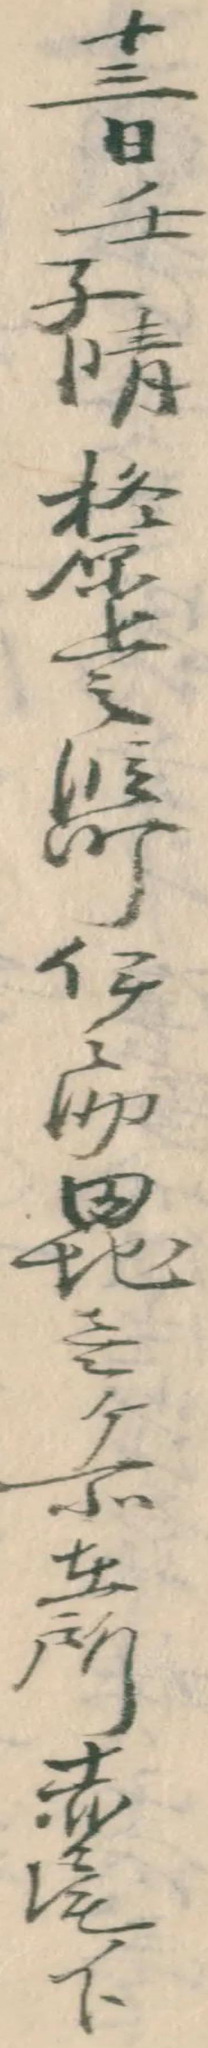十三日壬子晴柊原上之段町伊之助田地壱ケ所在所赤尾ノ下
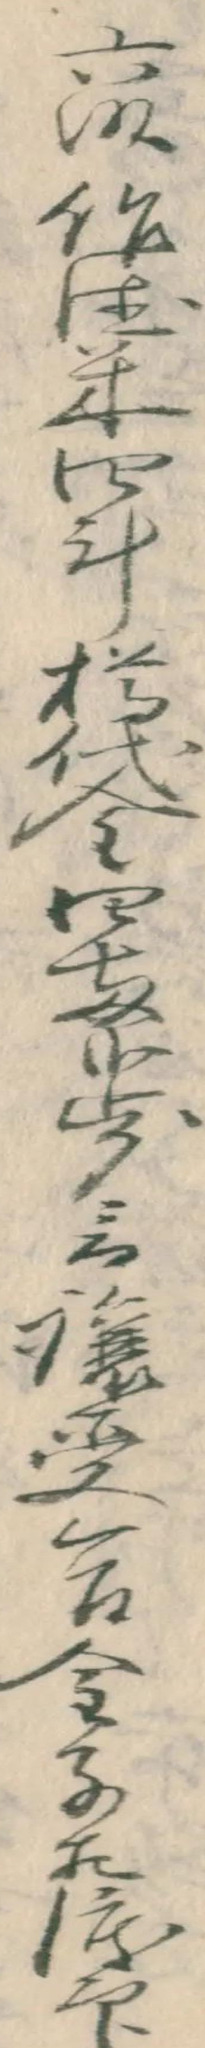六畝作徳米四斗樽代金四両弐歩ニ而譲受今日金子相渡印
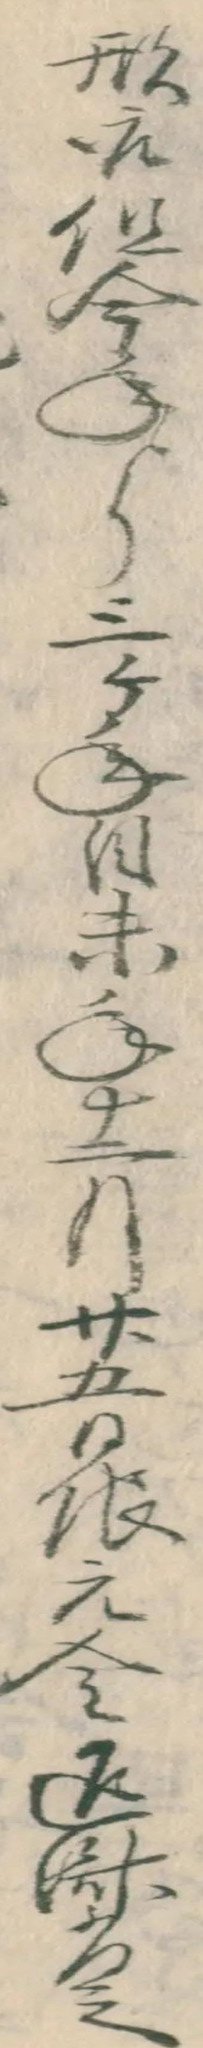形取但今年より三ヶ年目未年十二月廿五日限元金返済有之
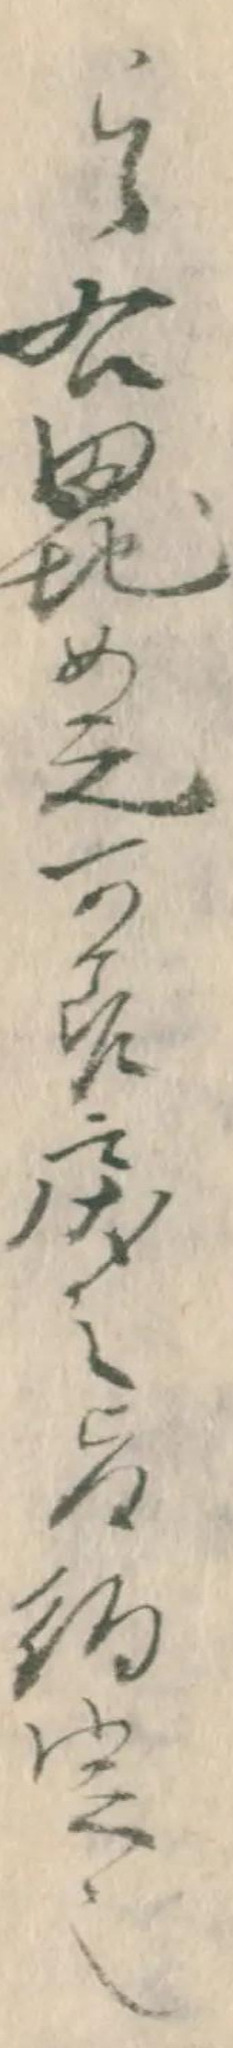已下右田地御之可差戻之旨約定也
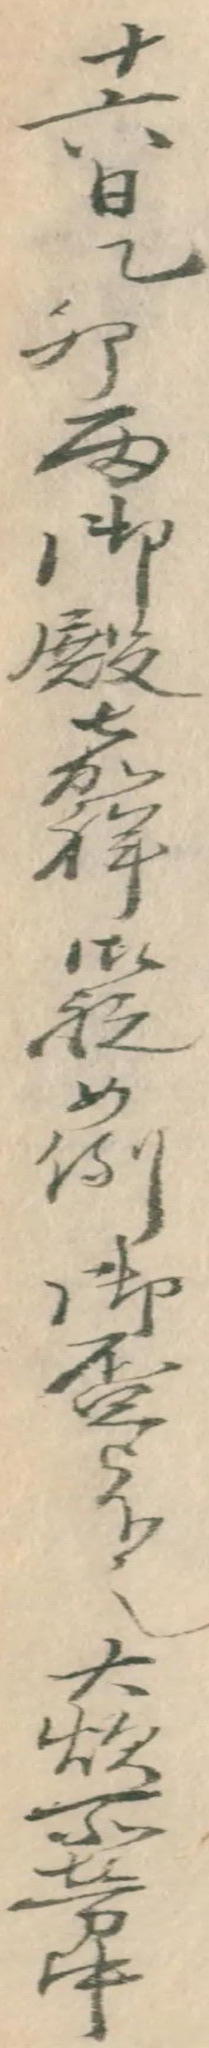十六日乙卯雨御殿嘉祥御祝如例御盃被下也大炊所労中

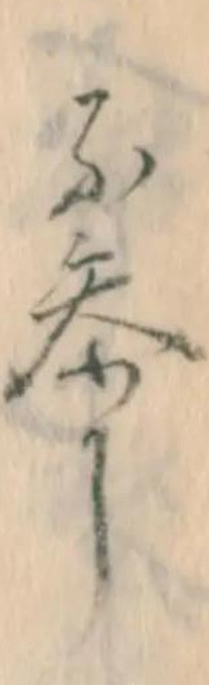不参了
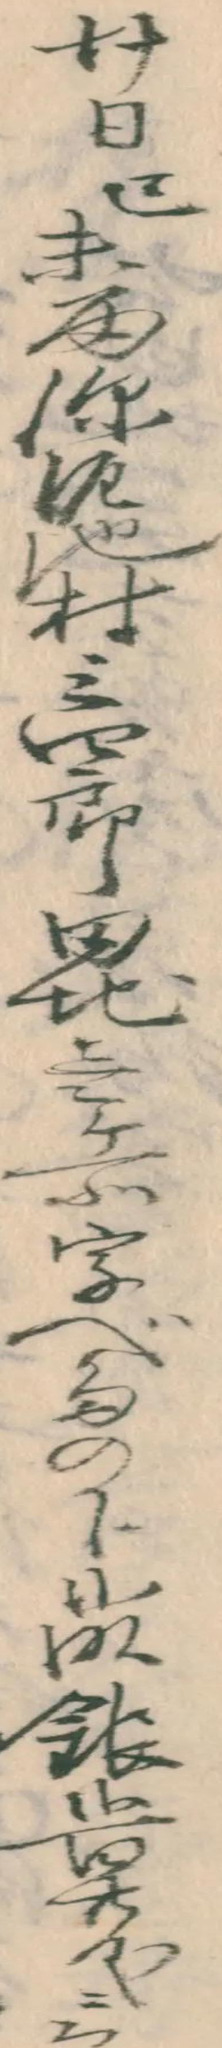廿日己未雨深泥池村三四郎田地壱ケ所字べたの下弐畝銀弐百廿匁ニ而
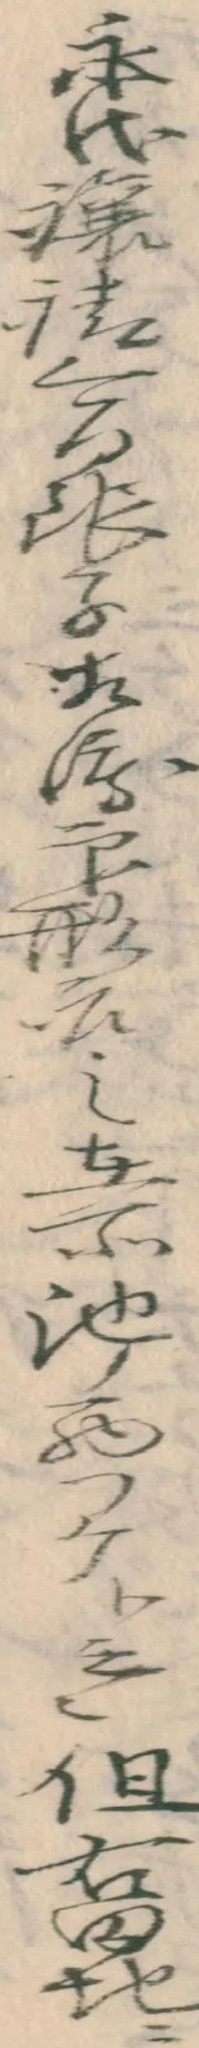永代譲請今日銀子相渡印形取也在所池ノ西フケト云〻但右田地ニ
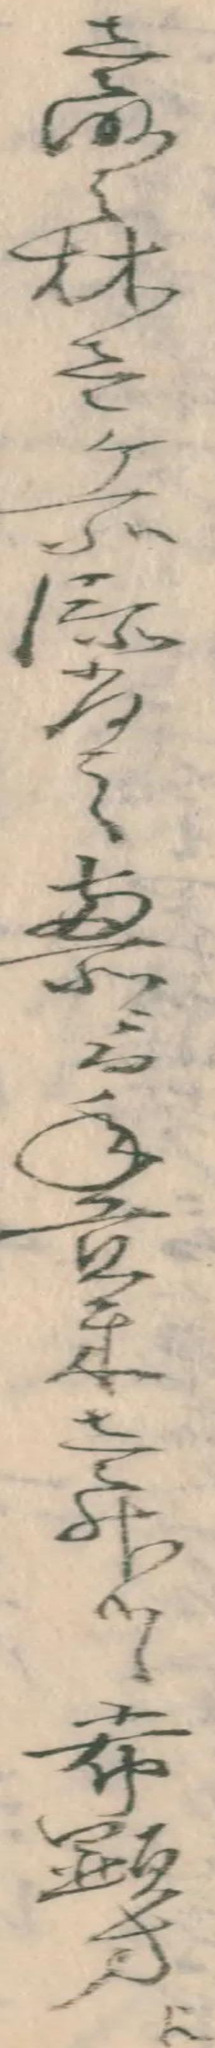壱畝之林壱ヶ所添有之両所ニ而年貢米壱升ツヽ希顕方え
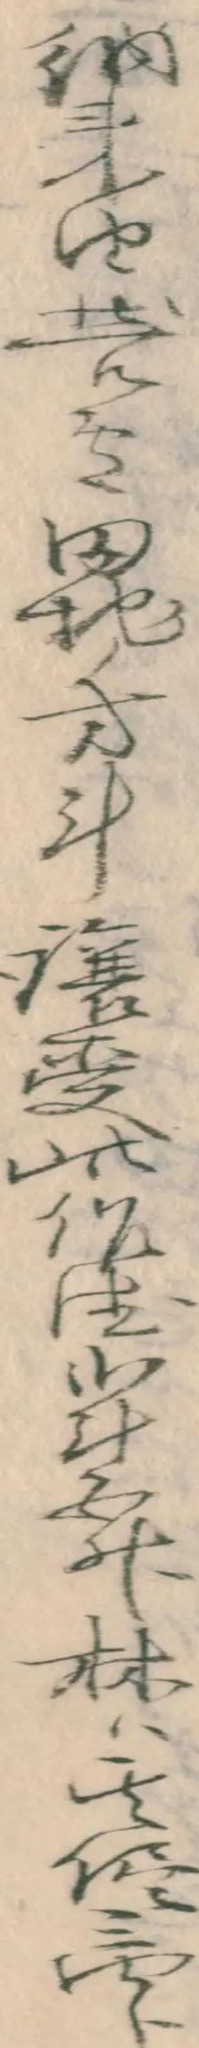納来由然ル處田地方斗譲受此作徳弐斗五升林ハ其侭三四郎
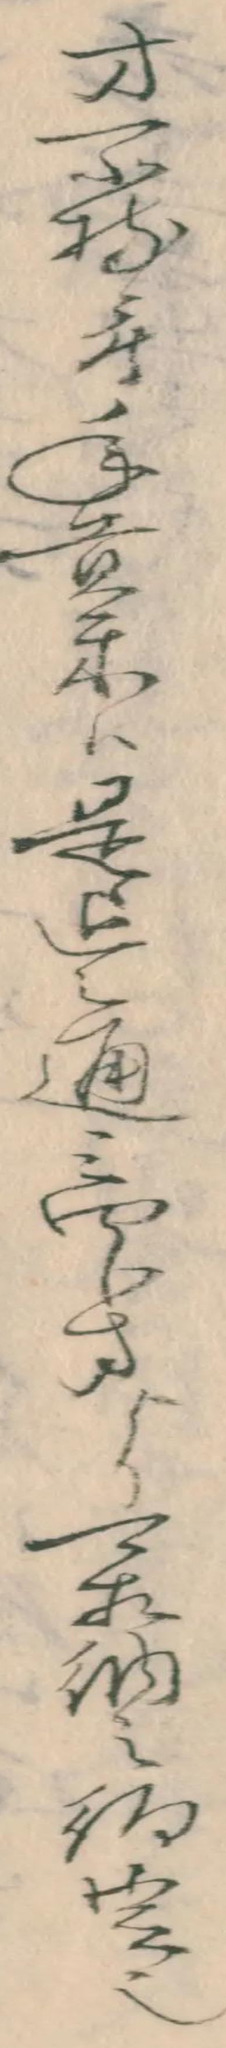方所持ニ付年貢米ハ是迄之通三四郎方より可相納之約定也
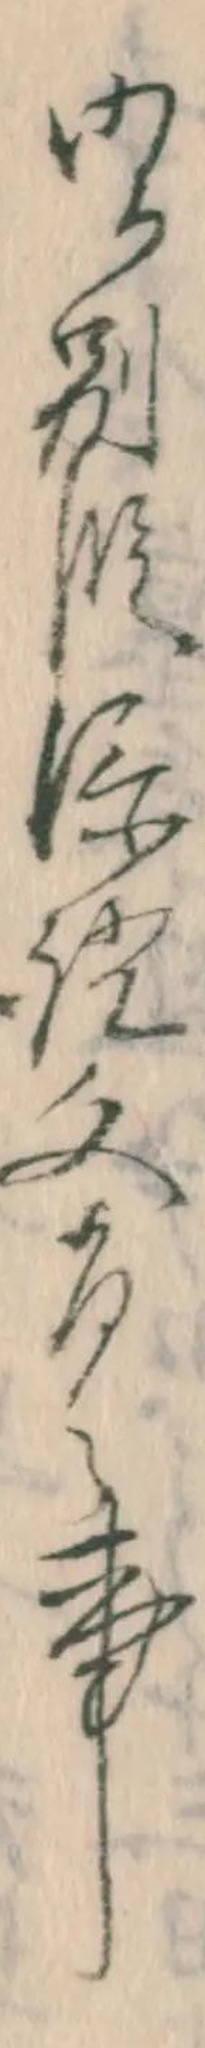仍而別段添證文有之事
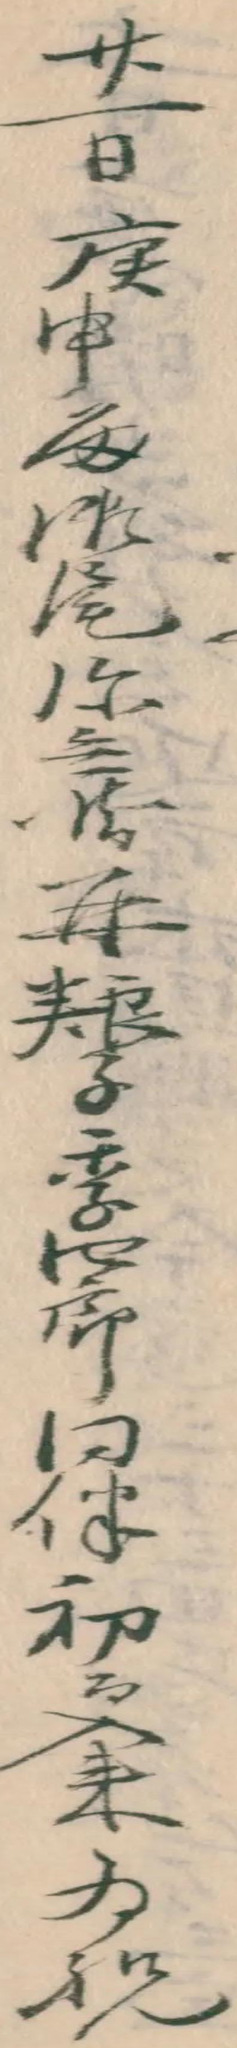廿一日庚申雨瀬尾弥兵衛再養子季四郎同伴初而入来為祝
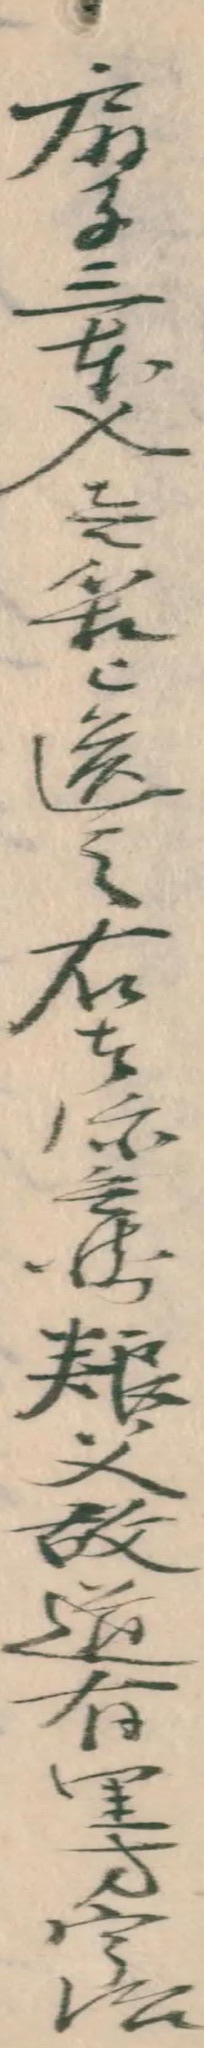扇子三本入壱箱被送之右は弥兵衛養父故道有里方宇治
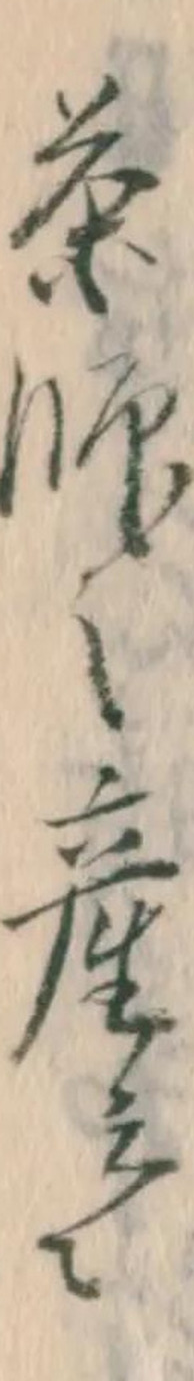茶師之産云々
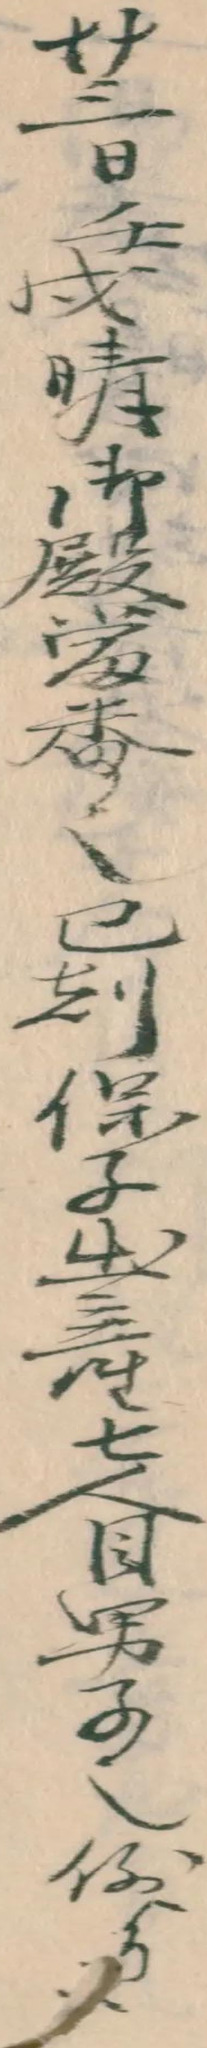廿三日壬戌晴御殿當番也巳刻保子出産七人目男子之儀より
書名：賀茂社記録. 第66冊
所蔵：国立国会図書館 National Diet Library, JAPAN
